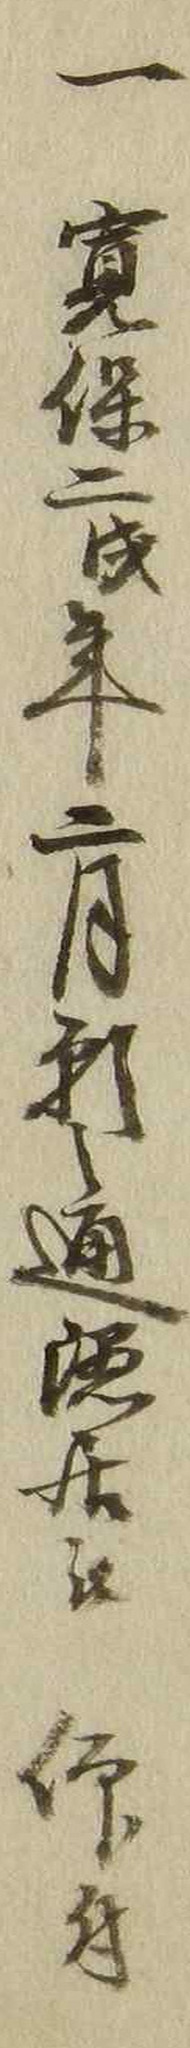一寛保二戌年二月願之通隠居被仰付
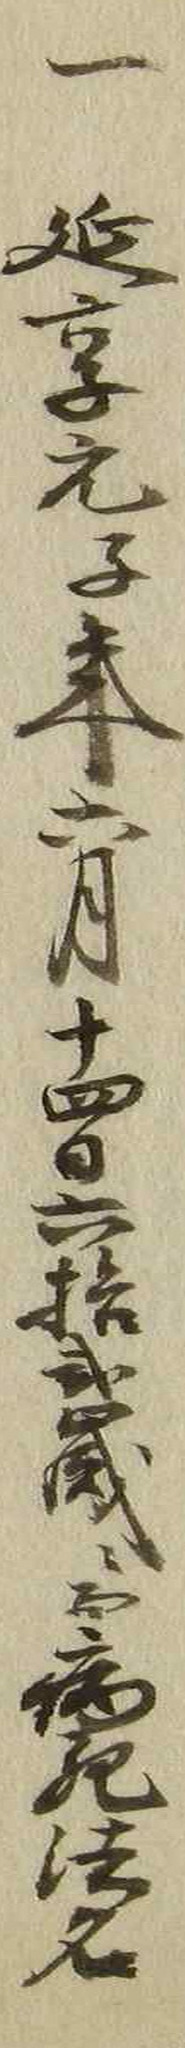一延享元子年六月十四日六拾弐歳ニ而病死法名
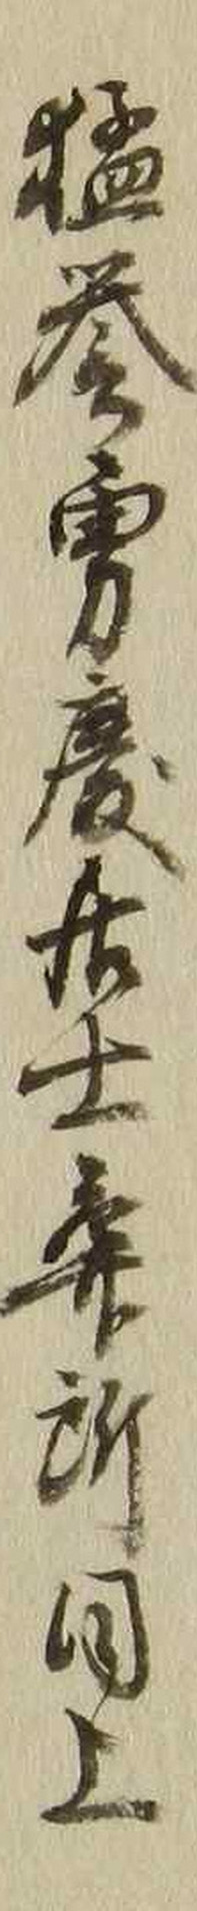猛誉勇慶居士葬所同上
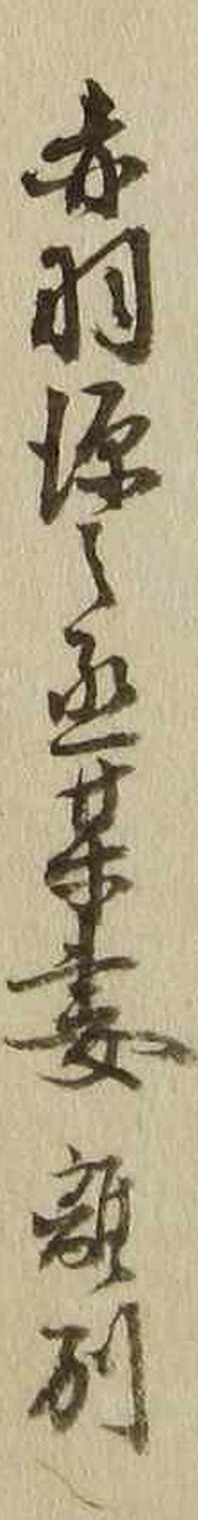赤羽源之丞某妻離別
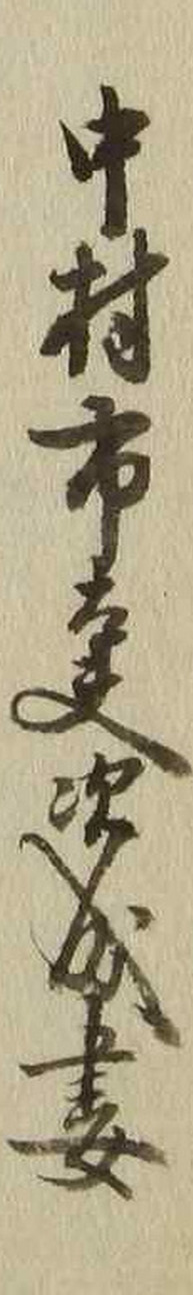女中村市太郎次成妻
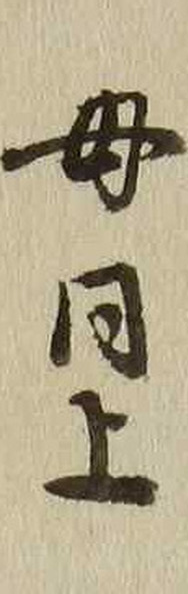母同上
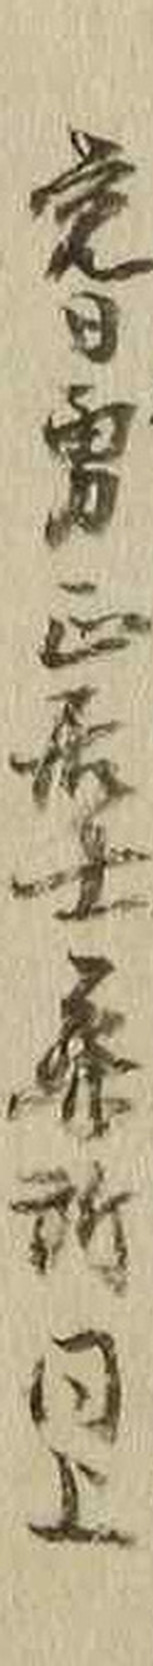猛誉勇慶居士葬所同上
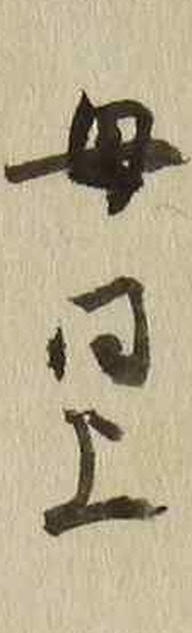母同上
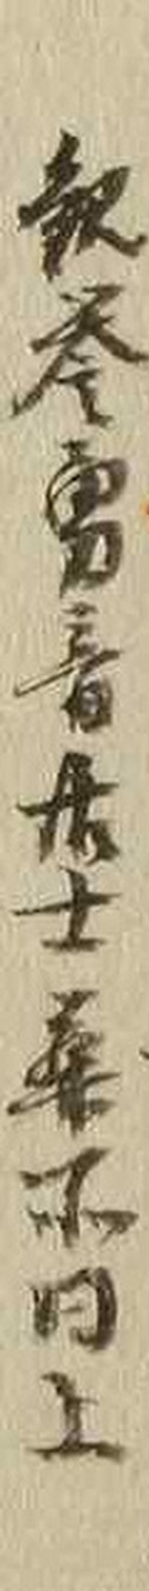猛誉勇慶居士葬所同上
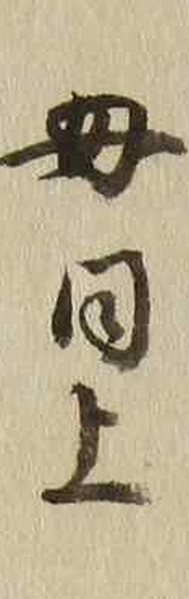母同上
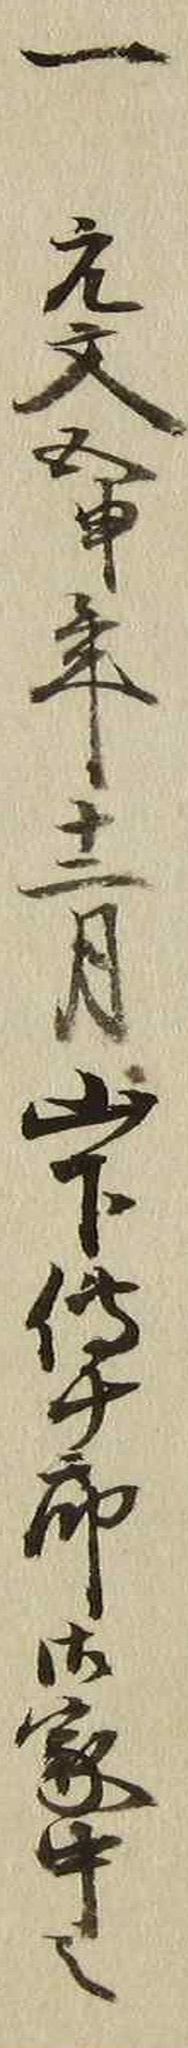一元文五申年十二月山下伝十郎御家中之
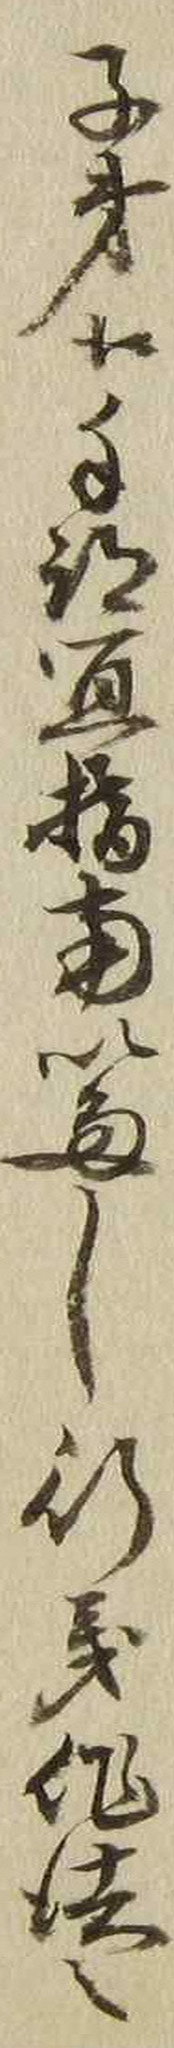子弟江手跡宜指南いたし行儀作法之
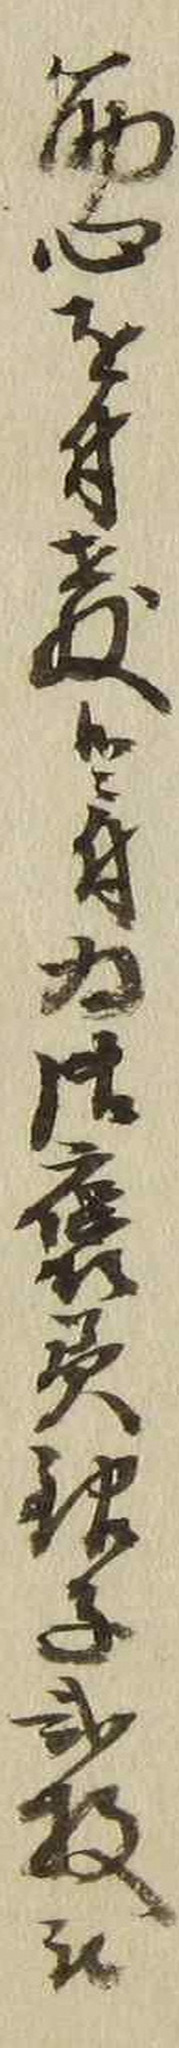筋心を付教候ニ付為御褒美銀子弐枚被
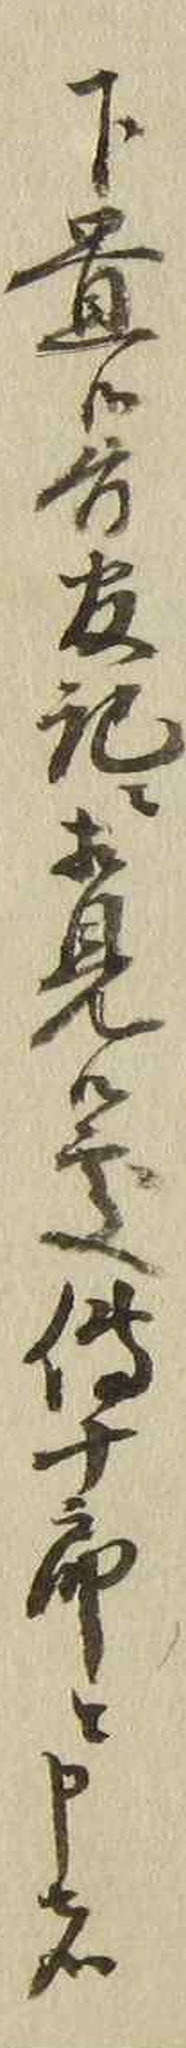下置候旨官記ニ相見候處伝十郎と申者
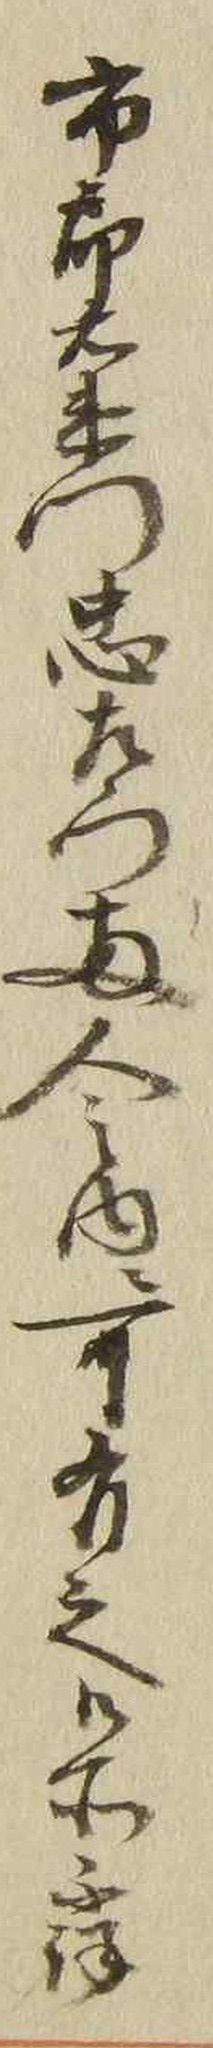市郎右衛門忠左衛門両人之内可有之候所不詳

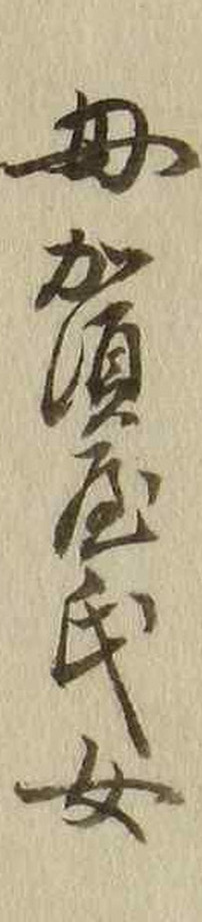母加須屋氏女
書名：諸士系譜　巻之64　と之部7
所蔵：会津若松市立会津図書館
